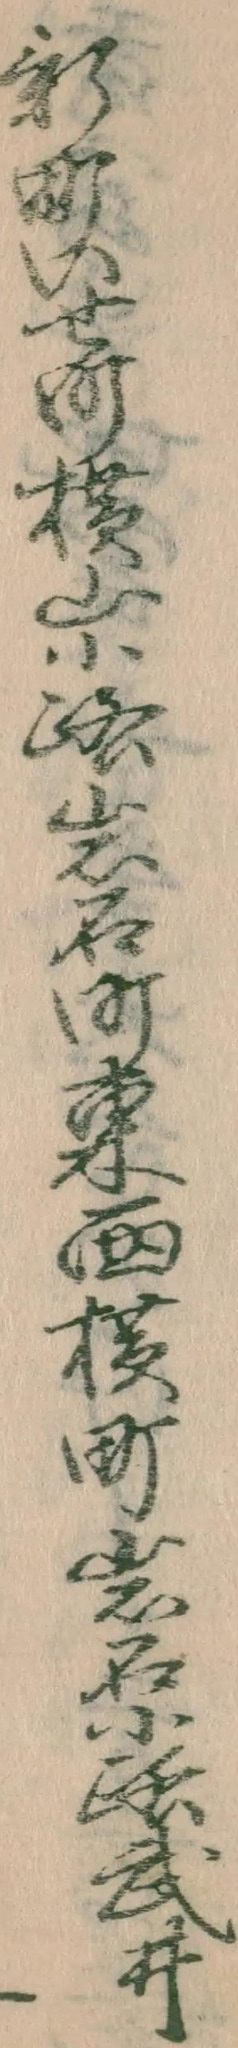新町いせ町横山小路岩石町東西横町岩石小路武井
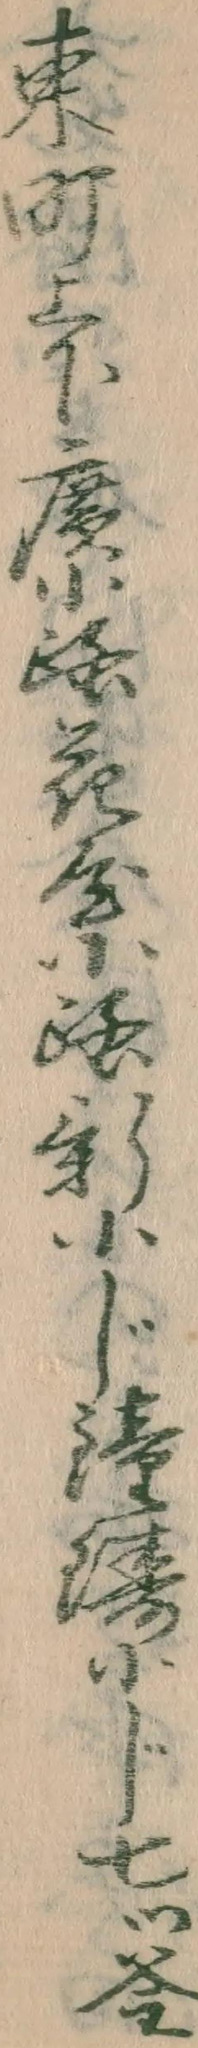東町上下広小路花屋小路新小じ鐘楼小じ七ッ釜
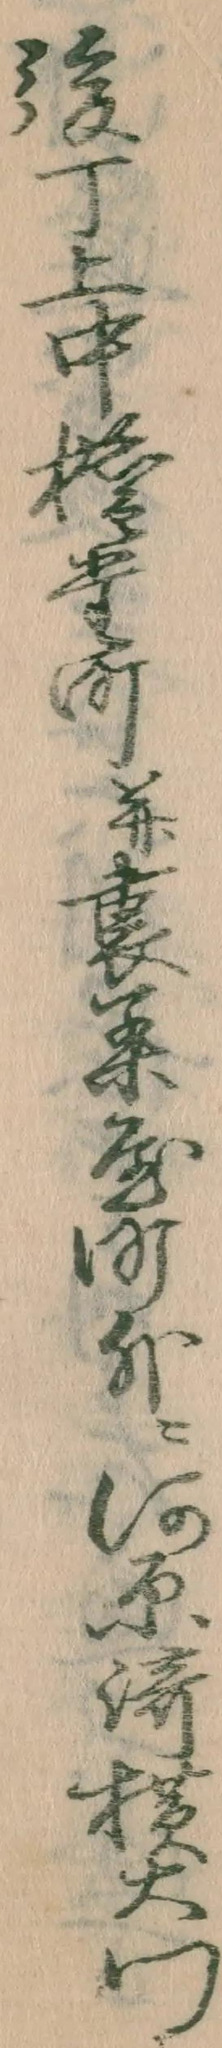後丁上中権堂町并裏茶屋町外二河原崎横大門
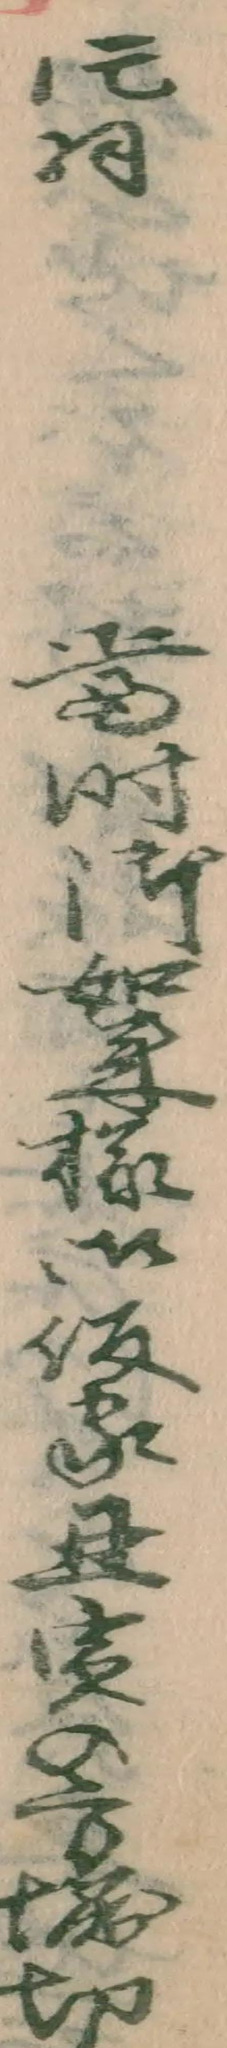トモ羽当時御如来様御仮家丑寅の方堀切
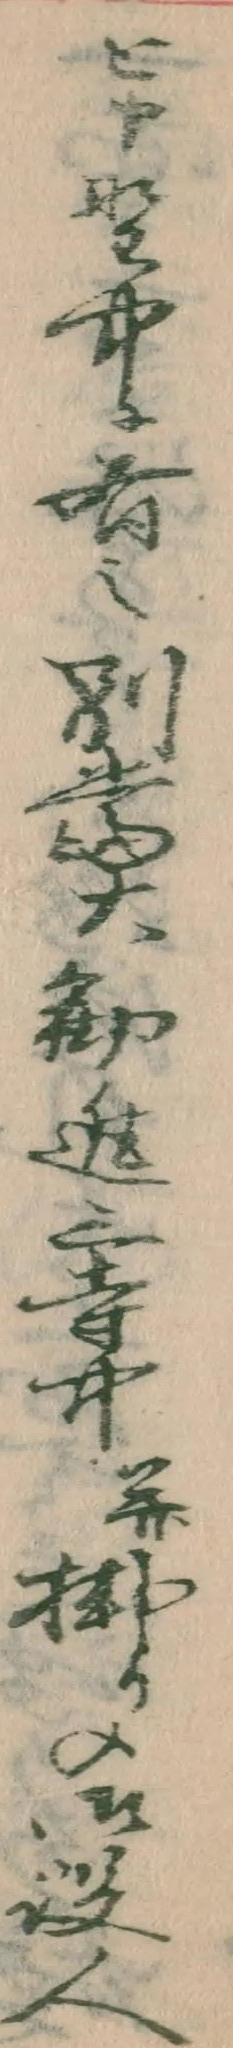と申野中ニ有之別当大勧進三寺中并掛りの御役人
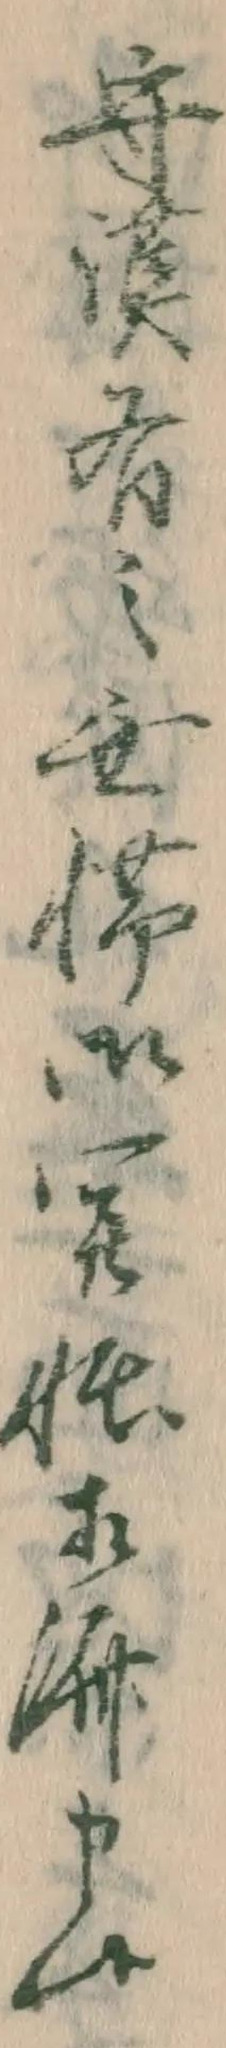守護有之無滞御開帳相済申候
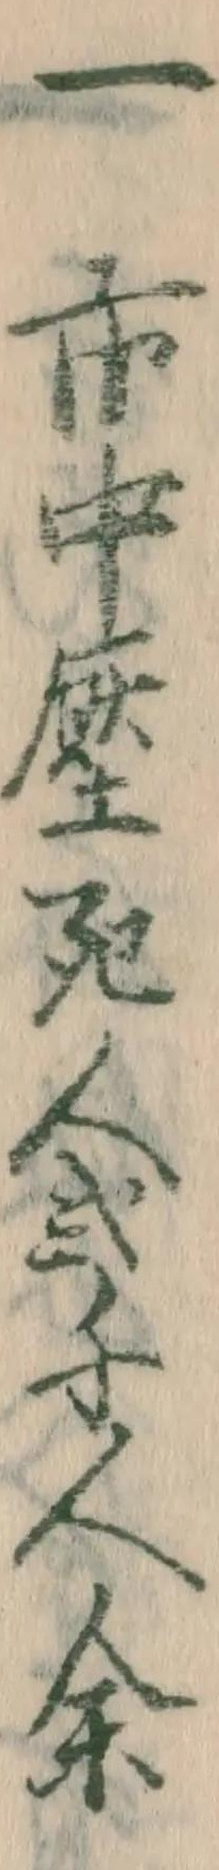一市中圧死人弐千人余
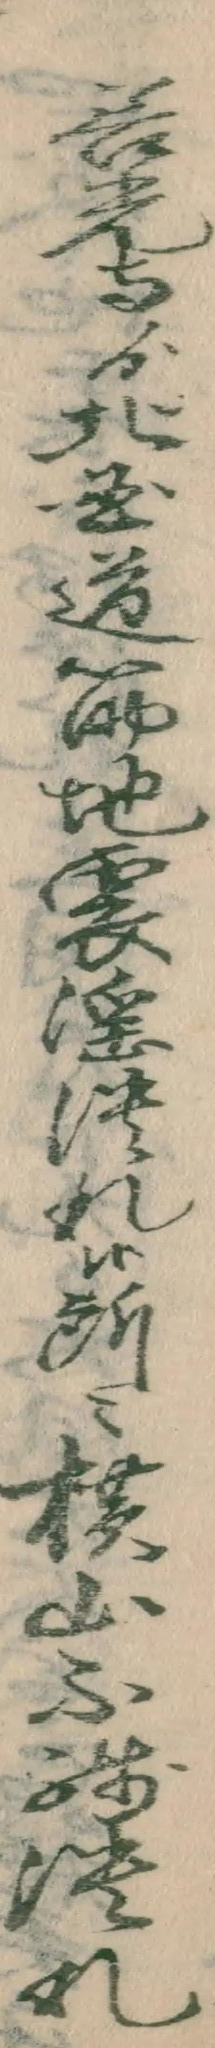一善光寺ゟ北国道筋地震揺潰れ候所々横山不残潰れ
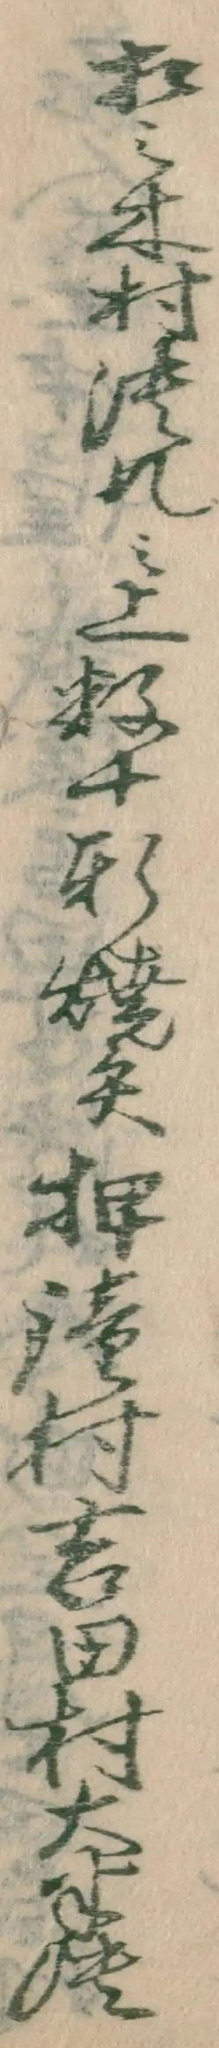相之木潰れ之上数十軒焼失押鐘村吉田村大半潰
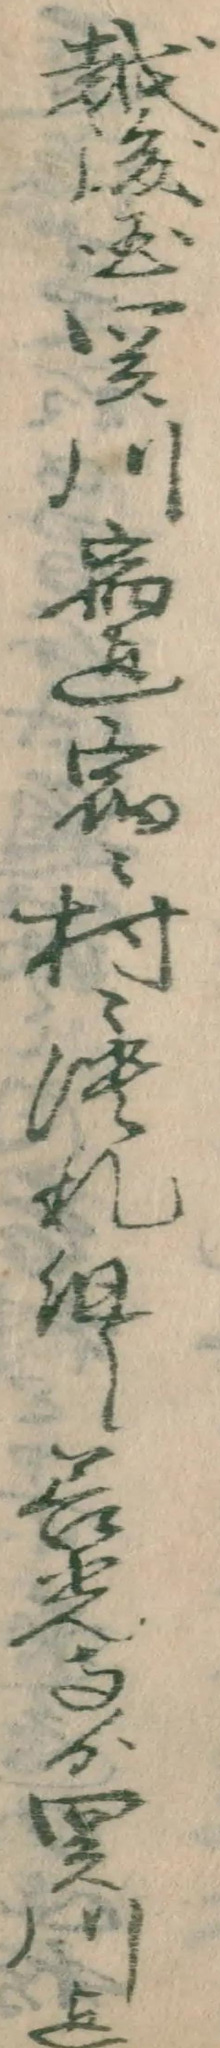越後国関川宿迄宿々村々潰れ但し善光寺ゟ関川迄

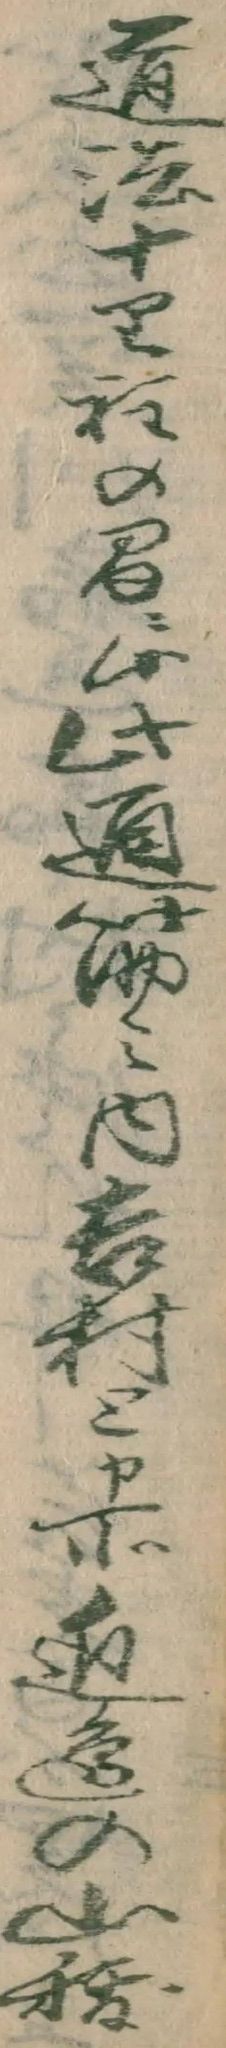道法十里程の間ニ候此通筋之内吉村と申所近辺の山抜
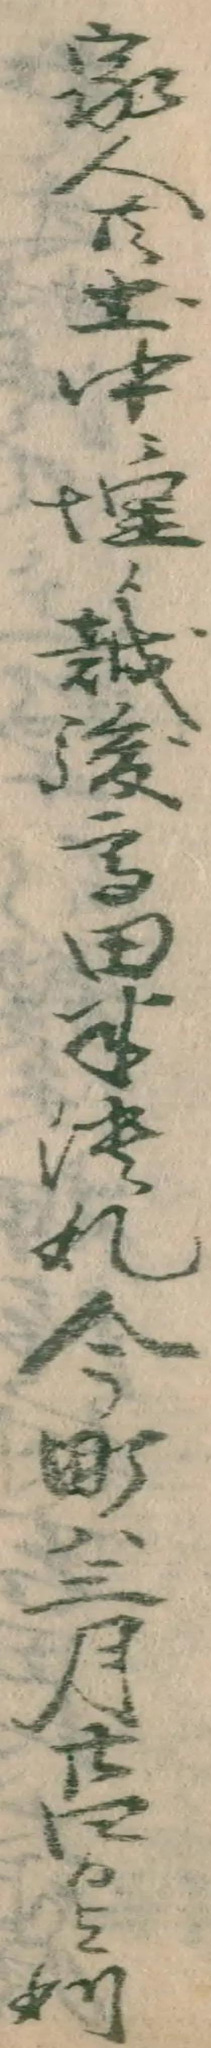家人共土中ニ埋候越後高田半潰れ今町は三月廿四日より
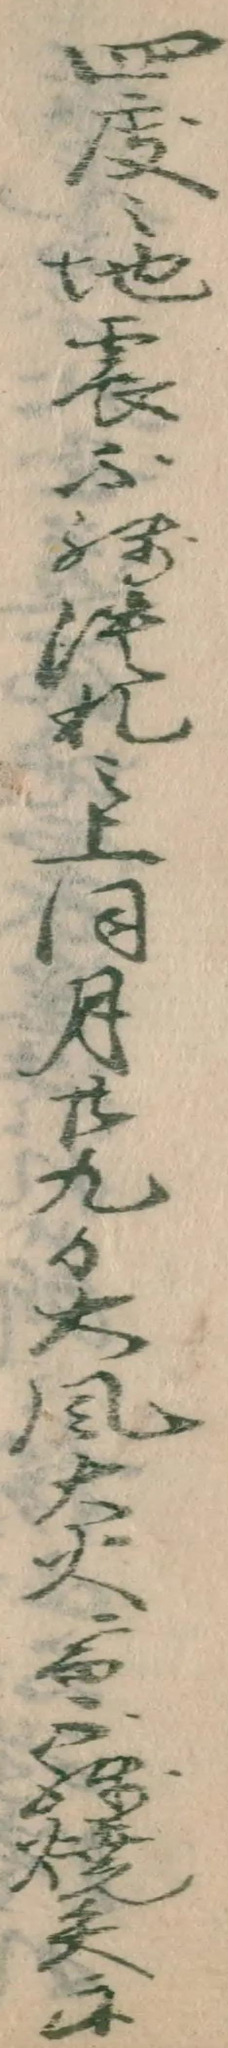四度之地震不残潰れ之上同月廿九日大風大火ニ而不残焼失ニ候
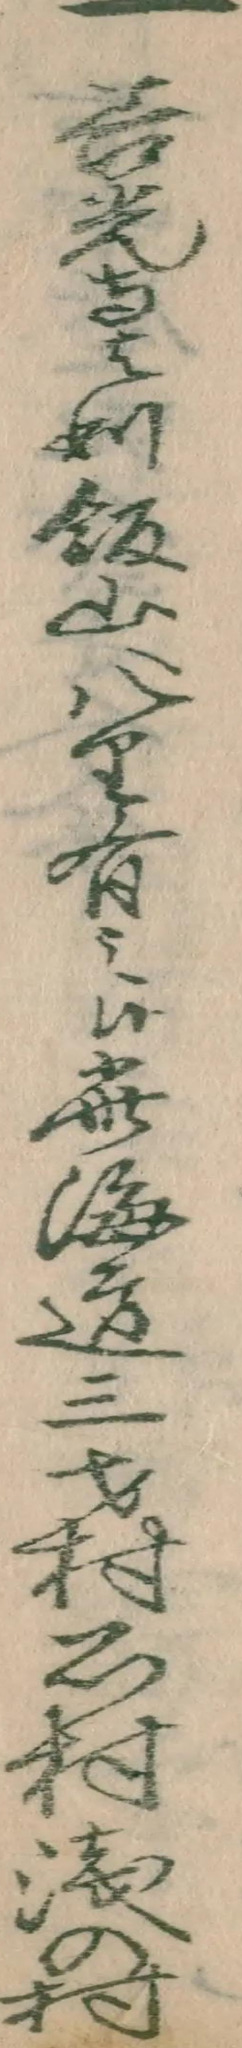一善光寺より飯山ヘ八里有之候此海道三才村石村浅の村
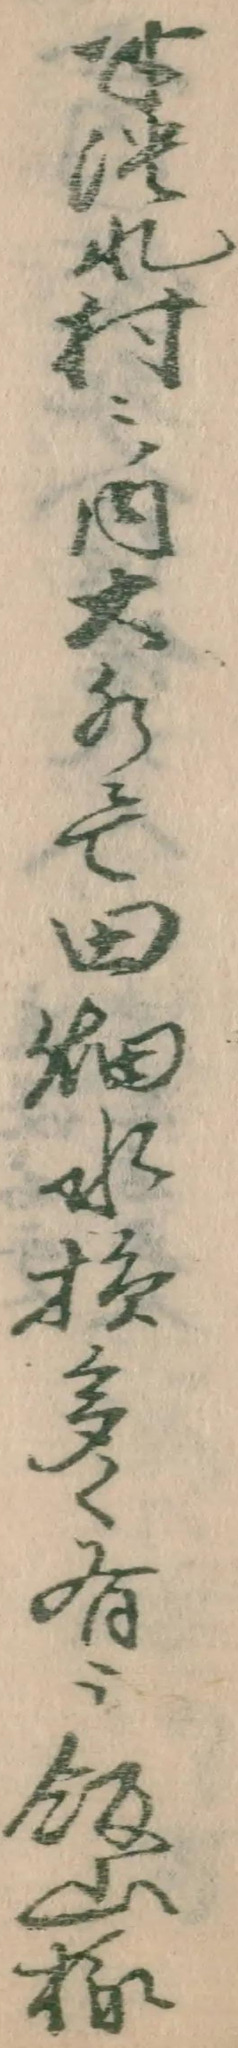半潰れ村々ノ内大水ニて田畑水損多く有之飯山様
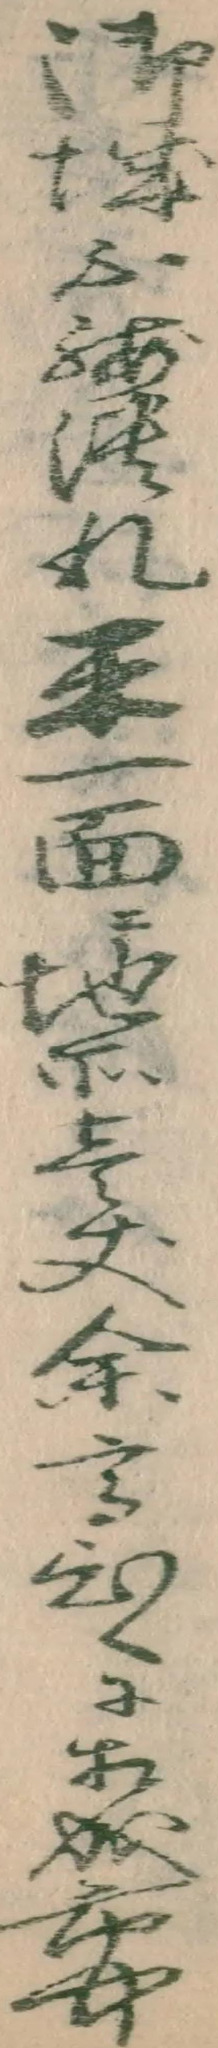御城不残潰れ平一面ニ地所壱丈余高ひくに相成市中
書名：大地震
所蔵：国立国会図書館 National Diet Library, JAPAN
